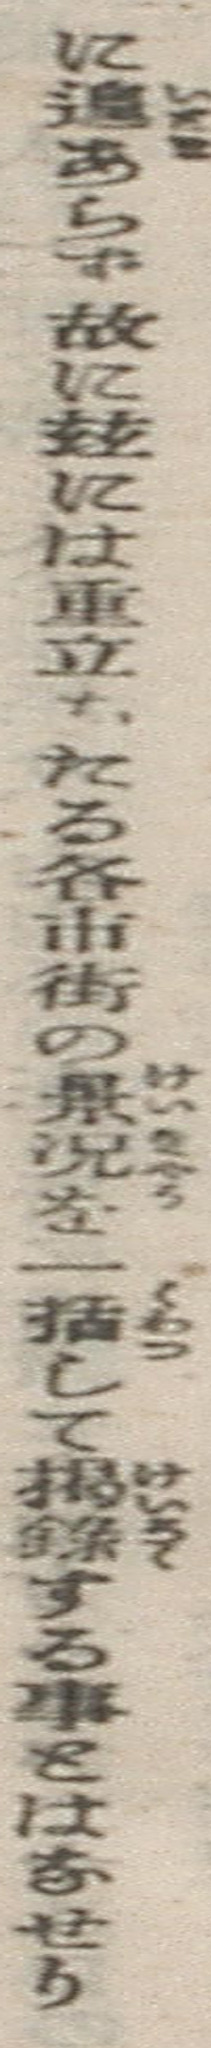に遑あらず故に玆には重立ちたる各市街の景況を一括して掲録する事とはなせり
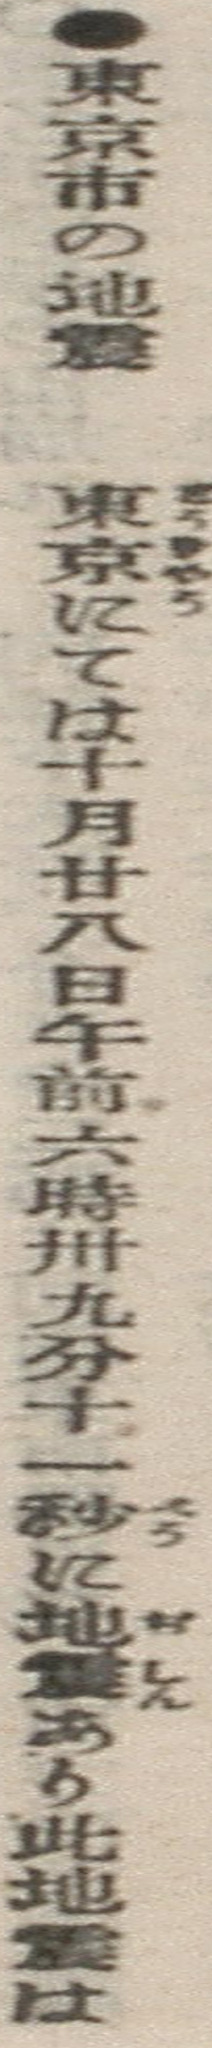●東京市の地震東京にては十月廿八日午前六時卅九分十一秒べうに地震あり此地震は
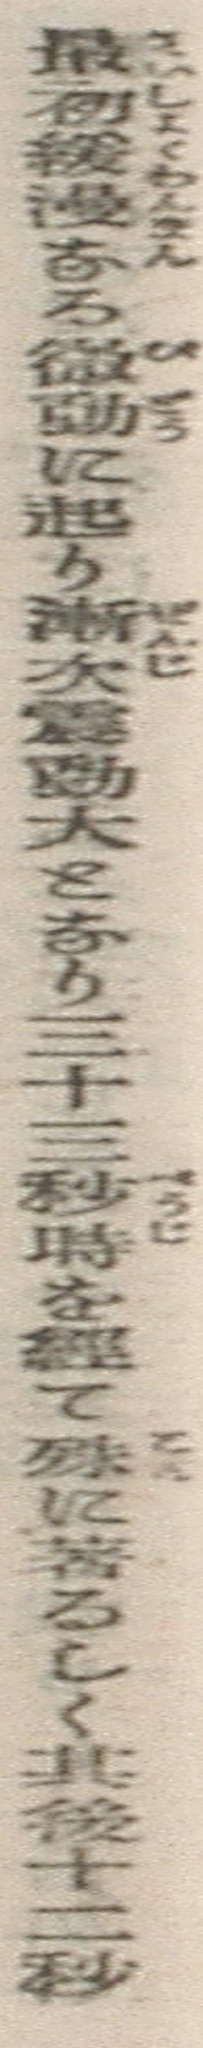最初緩慢なる微動に起り漸次震動大となり三十三秒時べうじを經て殊に著るしく其後十二秒
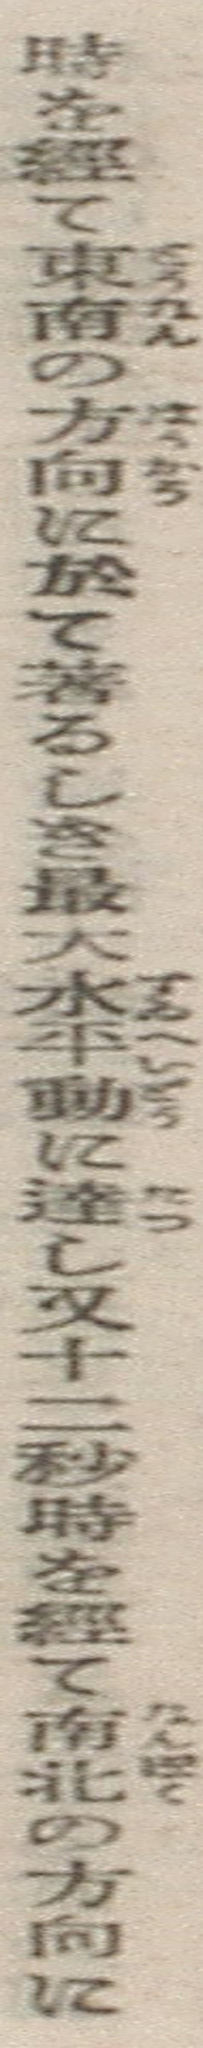時を經て東南の方向に於て著るしき最大水平動に達し又十二秒時を經て南北の方向に
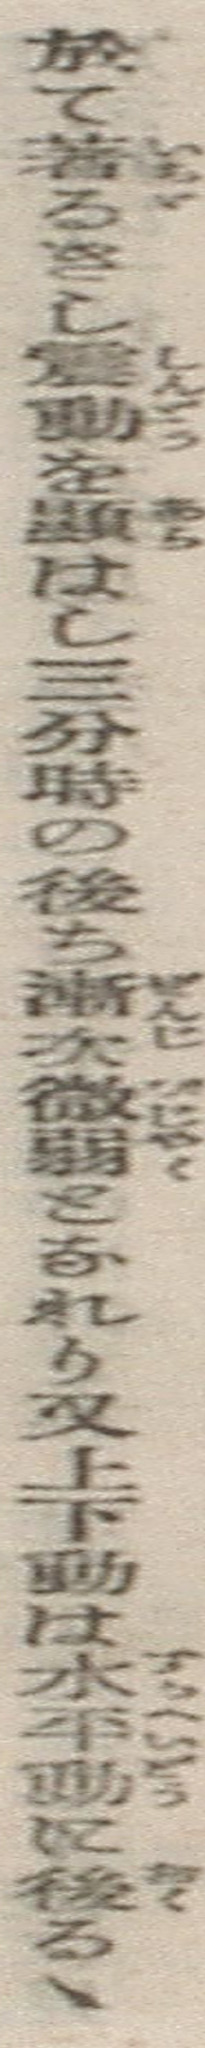於て著るきし震動を顕はし三分時の後ち漸次微弱となれり又上下動は水平動に後るゝ
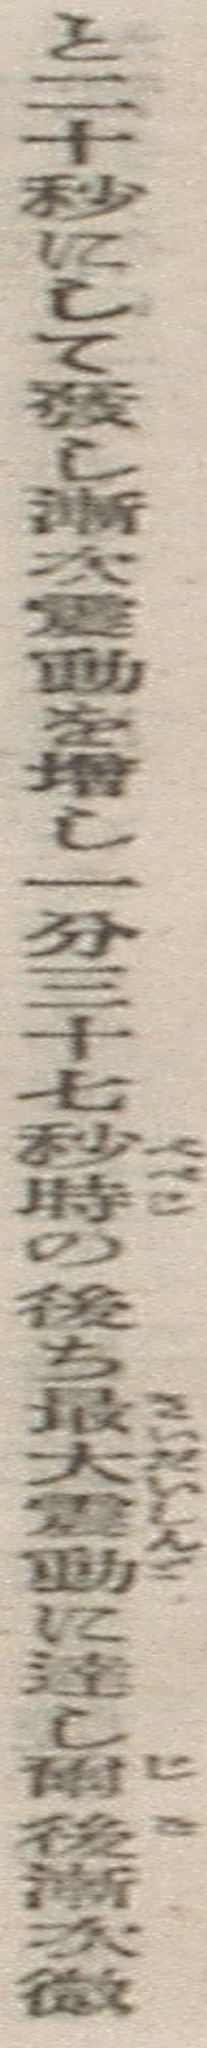こと二十秒にして発し漸次震動を増し一分三十七秒時の後ち最大震動に達し爾後漸次微
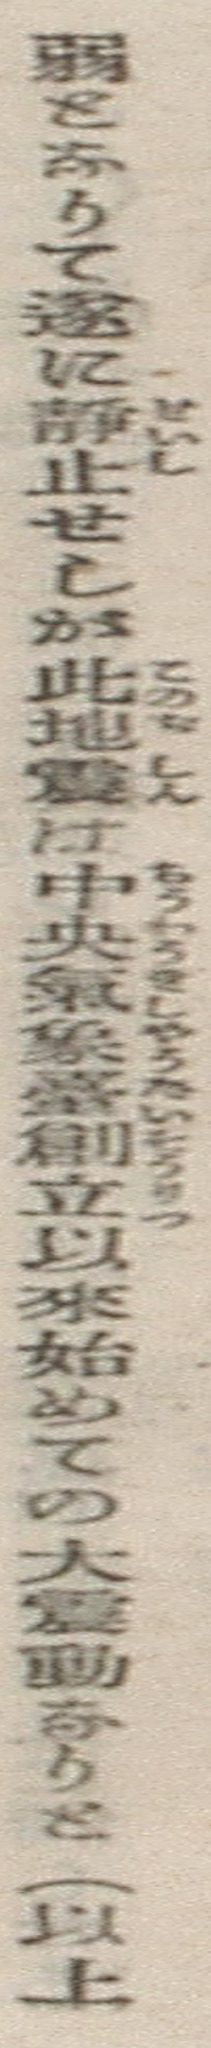弱となりて遂に静止せしが此地震は中央気象臺創立以来始めての大震動なりと（以上
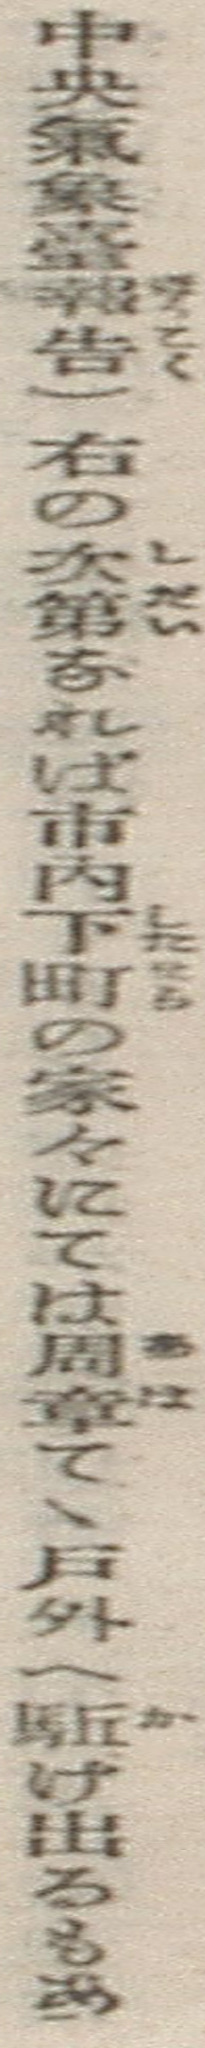中央気象臺報告）右の次第なれば市内下町の家々にては周章てゝ戸外へ駈け出るもあ
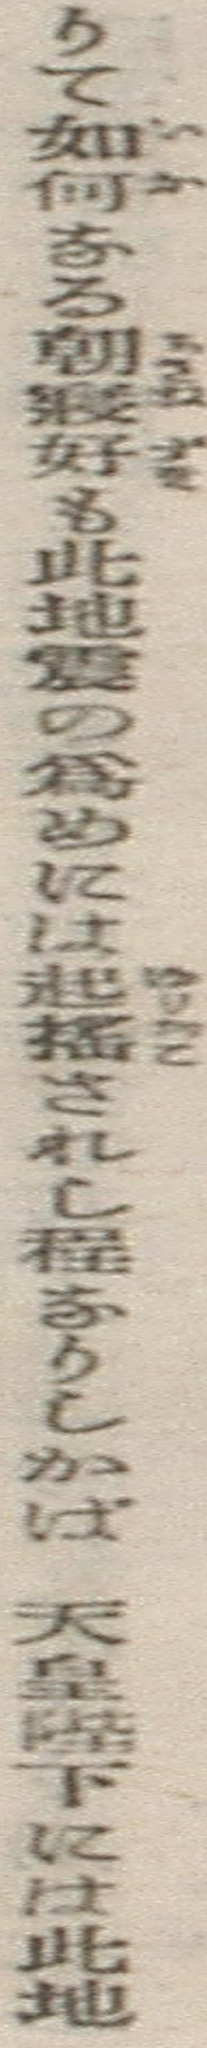りて如何なる朝寝好も此地震の為めには起揺されし程なりしかば天皇陛下には此地
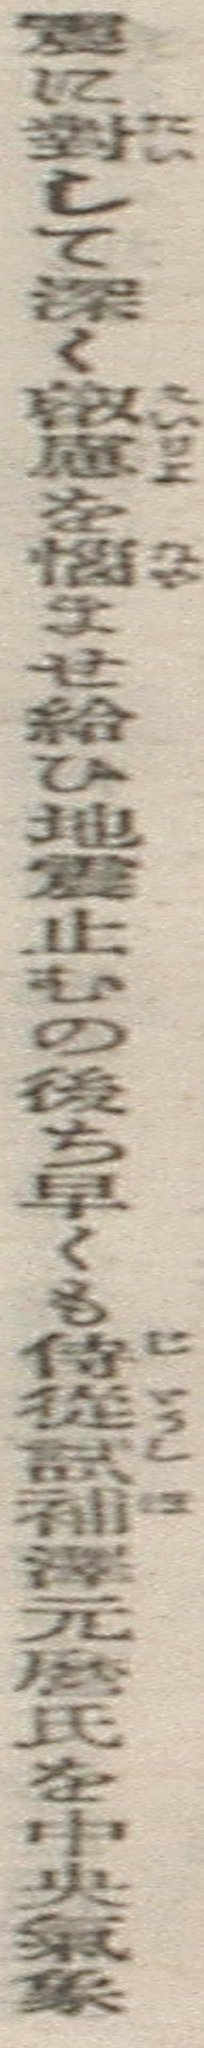震に對して深く叡慮を悩ませ給ひ地震止むの後ち早くも侍従試補澤元麿氏を中央気象
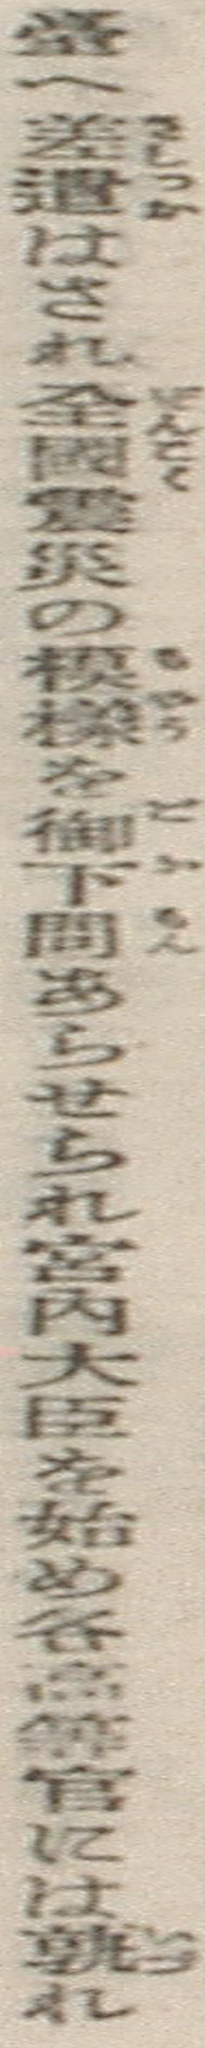臺へ差遣はされ全国震災の模様を御下問あらせられ宮内大臣を始め各高等官には就れ
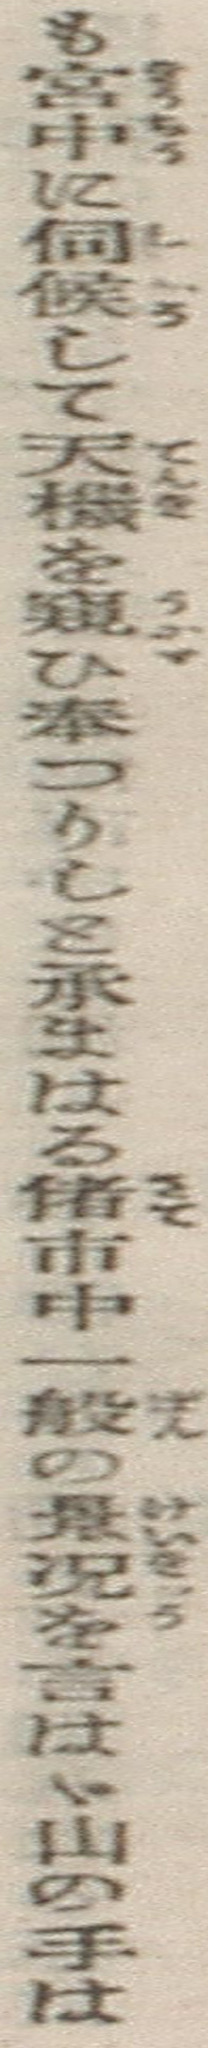も宮中に伺候して天機を窺ひ奉つりしと承まはる猪市中一般の景況を言はゞ山の手は
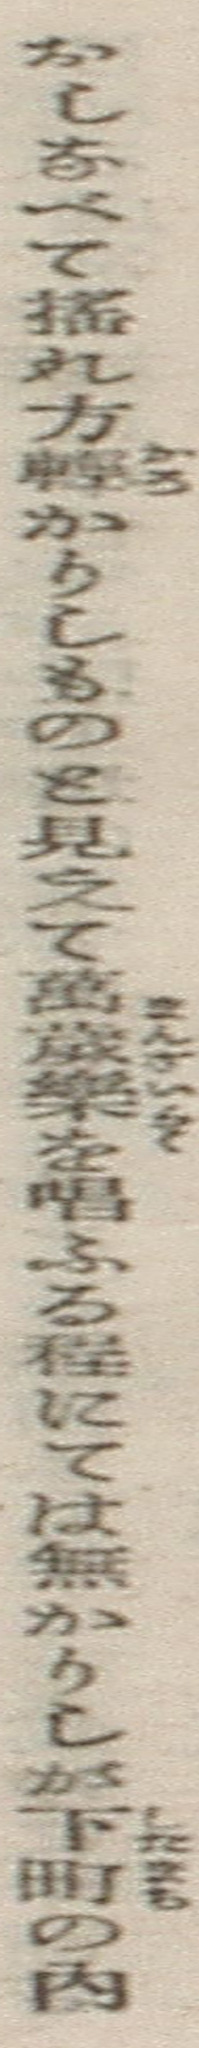おしなべて揺れ方軽かりしものと見えて萬歳樂を唱ふる程にては無かりしが下町の内
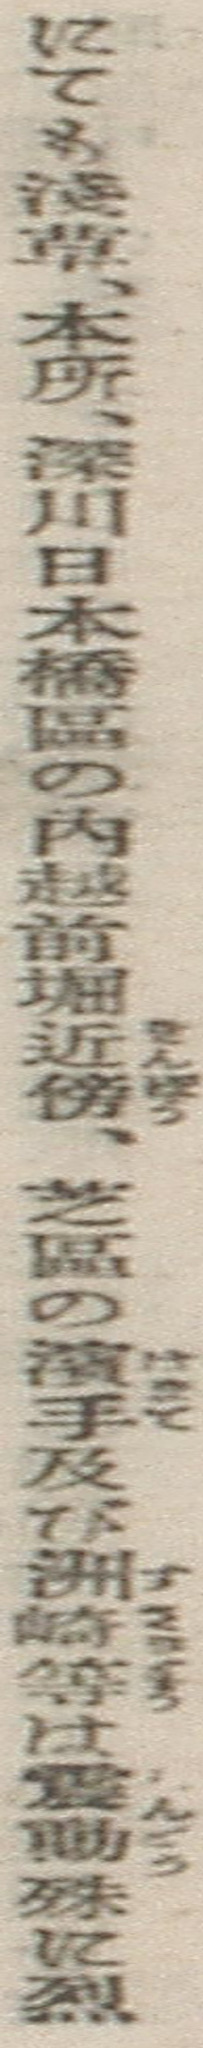にても浅草、本所、深川日本橋區の内越前堀近傍、芝區の濱手及び洲崎等は震動殊に烈
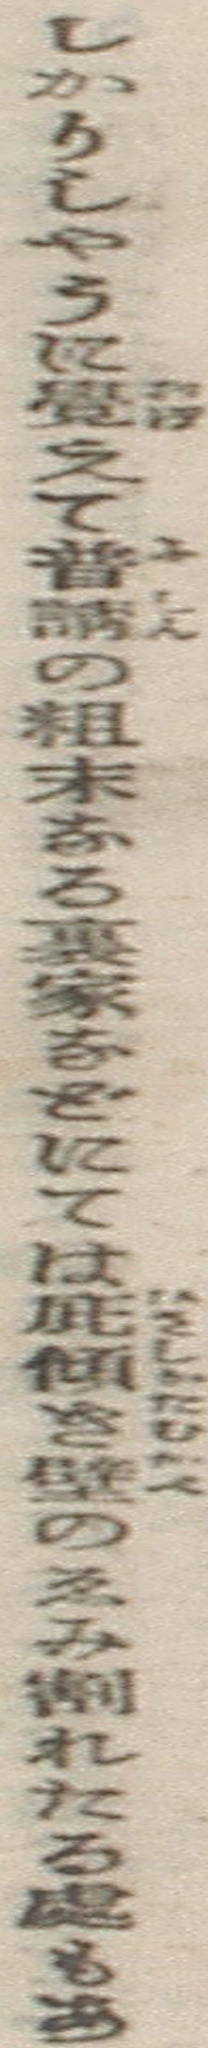しかりしやうに覚えて普請の粗末なる裏家などにて庇傾き壁のゑみ割れたる處もあ

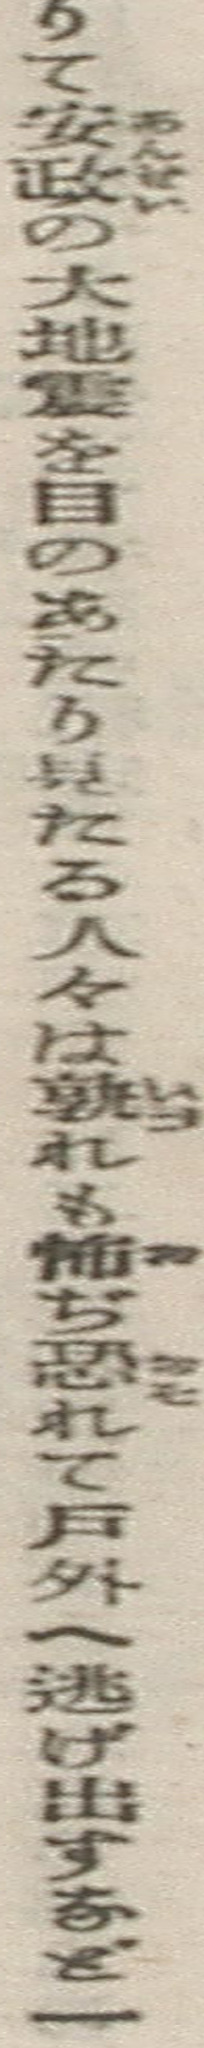りて安政の大地震を目のあたり見たる人々は就れも怖ぢ恐れて戸外へ逃げ出すなど一
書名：愛知岐阜福井三県　大地震見聞録（内題）
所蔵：東京大学地震研究所図書室 Earthquake Research Institute Library, The University of Tokyo, JAPAN
